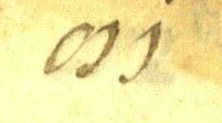81
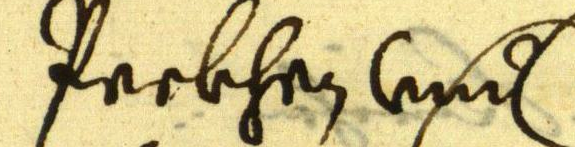Peckhen vnd
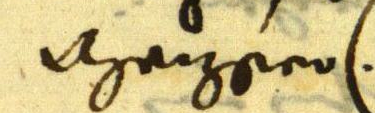Mezger.
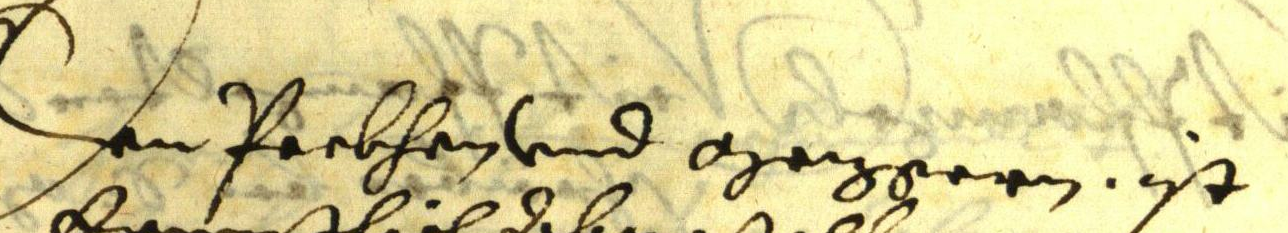Den Peckhen vnd Mezgern. ist
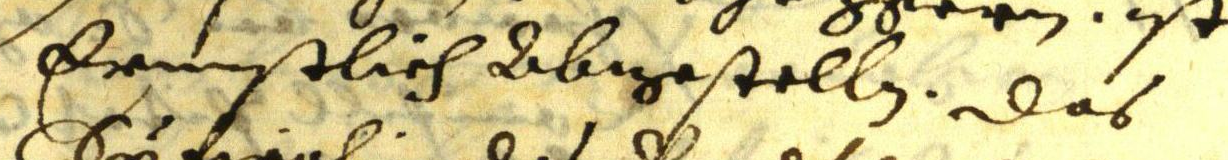Ernnstlich Abzestelln. das
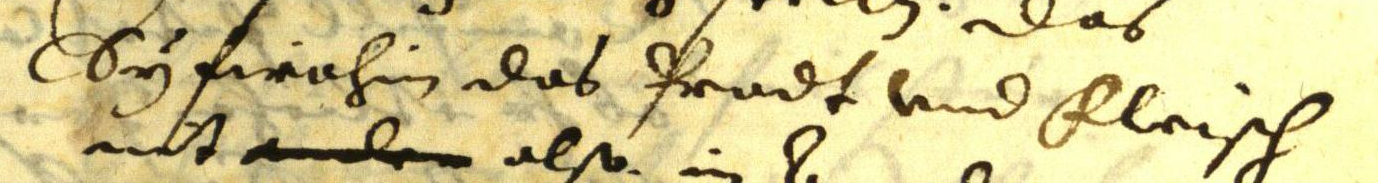Sȳ firohin das Prodt vnd Fleisch
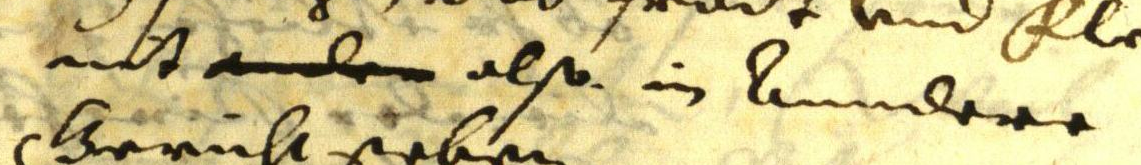nit ander also. in Anndere
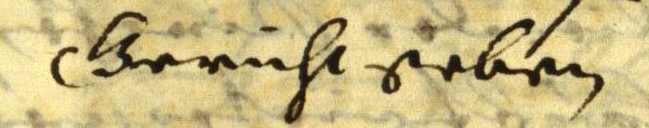Gericht geben
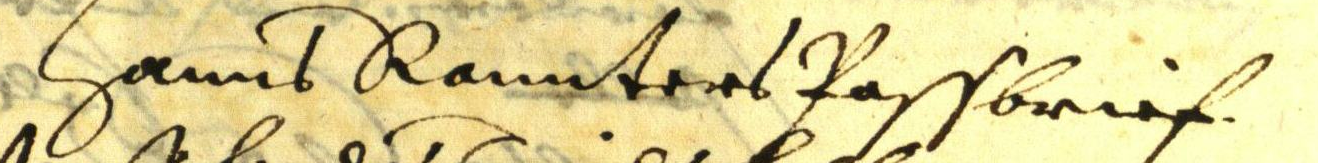Hanns Rannters Passbrief.
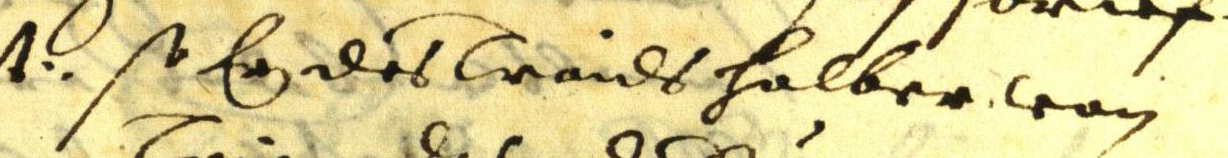so Er des Traids halber. von
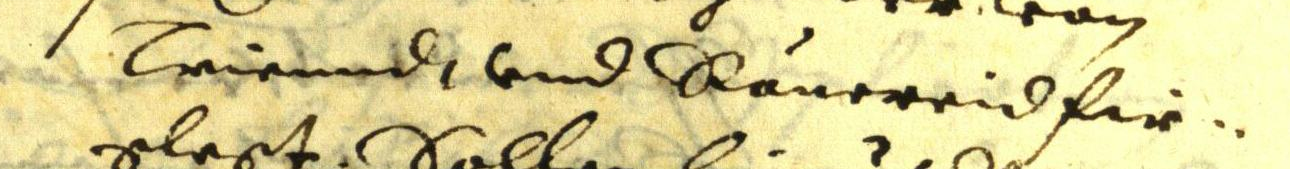Trienndt vnd Roūereid fir¬
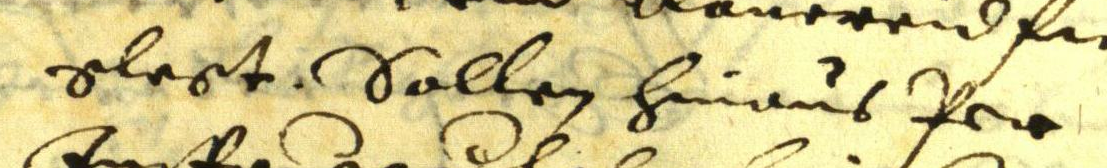glegt. Sollen hinaūs Per
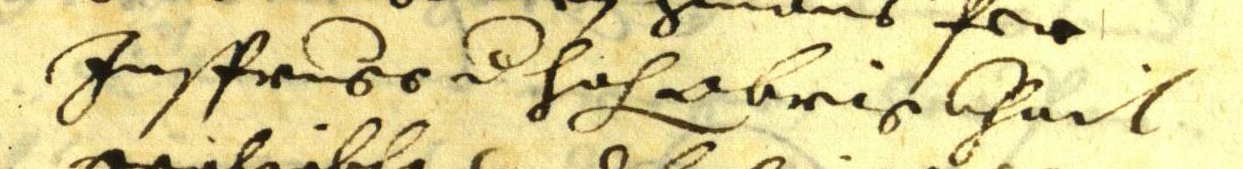Insprūgg d hoh Obrigkhait
